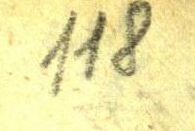118
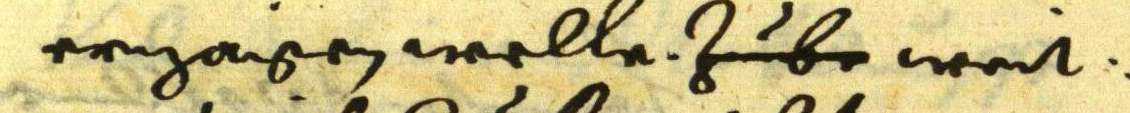erzaigen welle. Zū be weit¬
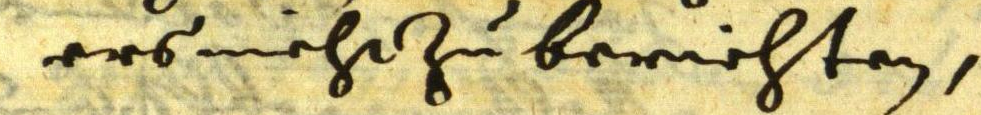ers nicht Zū berichten,
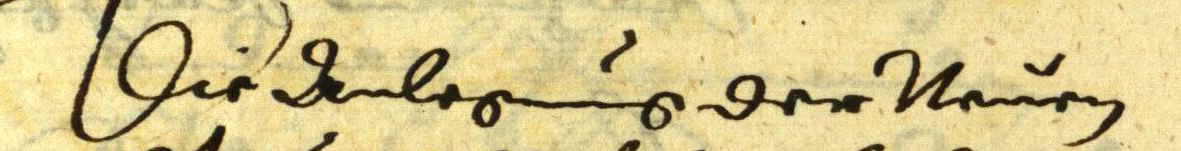Die Anlegūng der Neūen
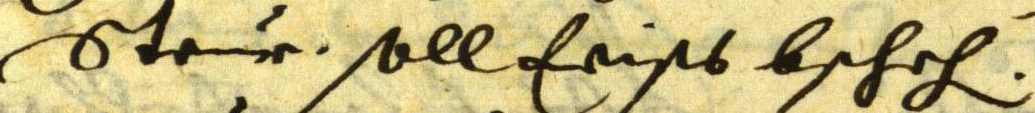Steūr. soll Eeist bscheh.
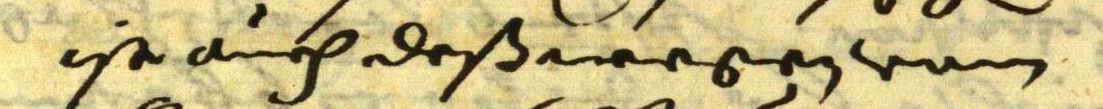ist aūch deßwegen vom
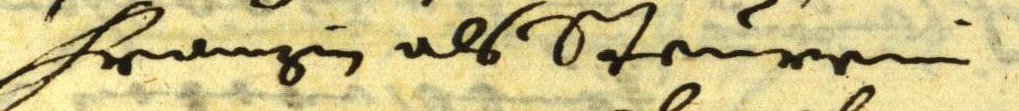Franzin als Steūrein¬
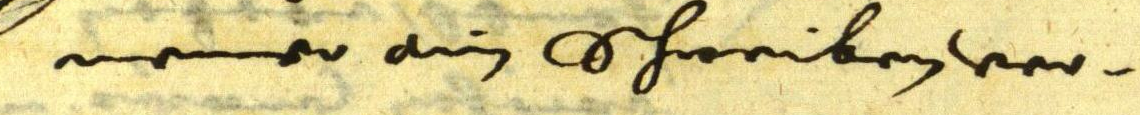nemer ain Schreiben ver¬
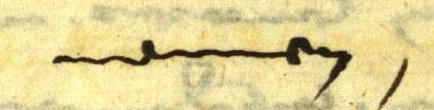nomen,
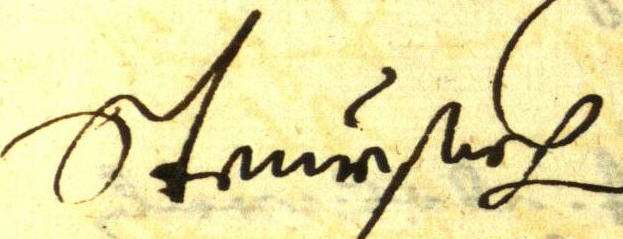Steūrsach
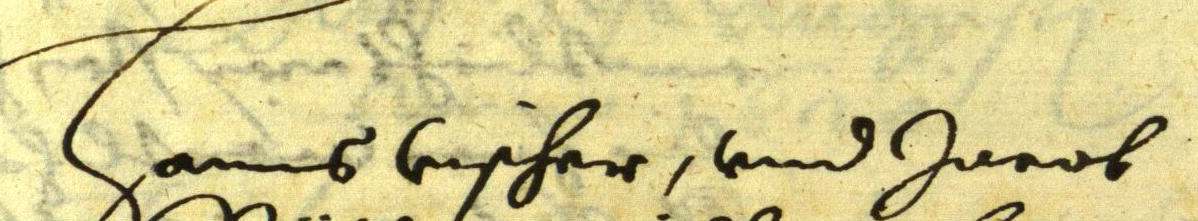Hanns vischer, vnd Jacob
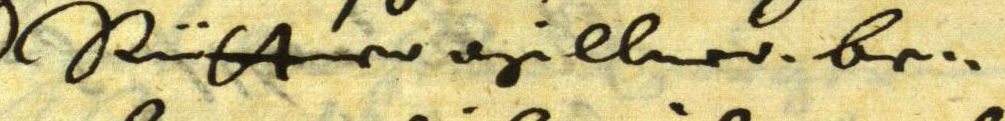Rüttner Millner. be¬
